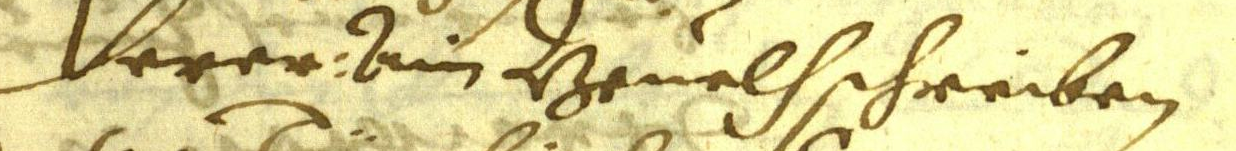Verer: Ain Beūelhschreiben
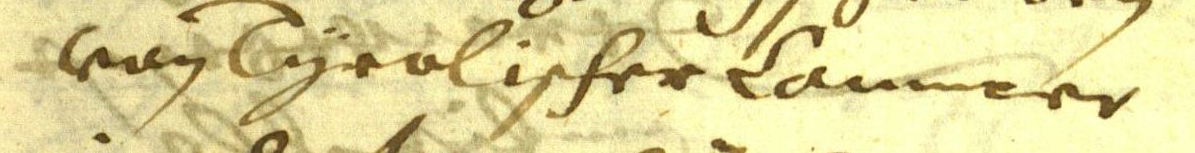von Tÿrolischer Cammer
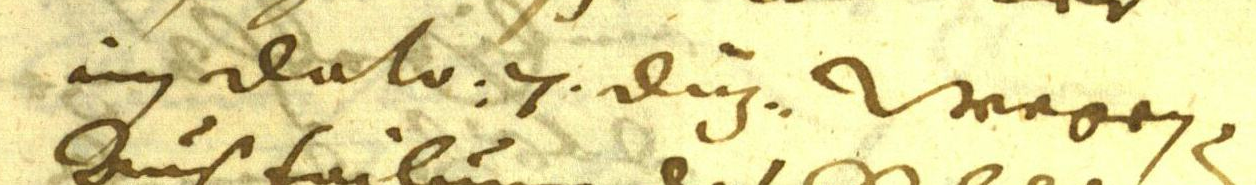im dato: 7. diz: Wegen
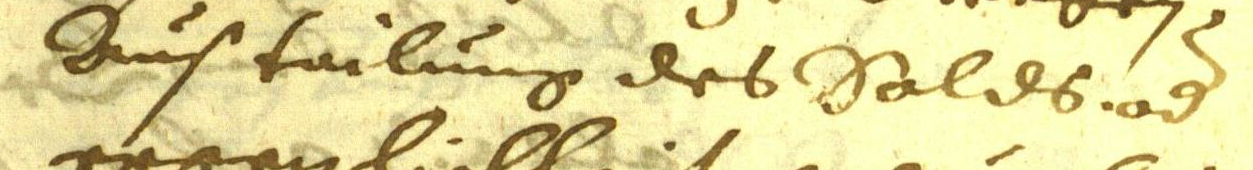Aūs tailūng des Solds. od
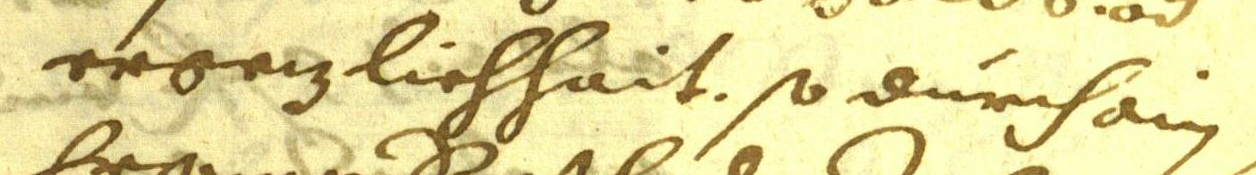ergezlichhait. so dūrch ain
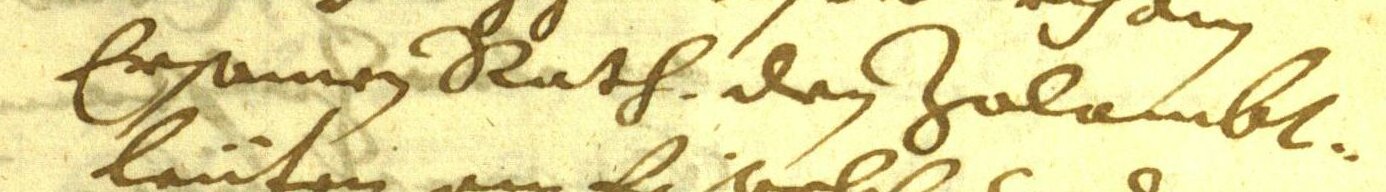Ersamen Rath. den Zolambt¬
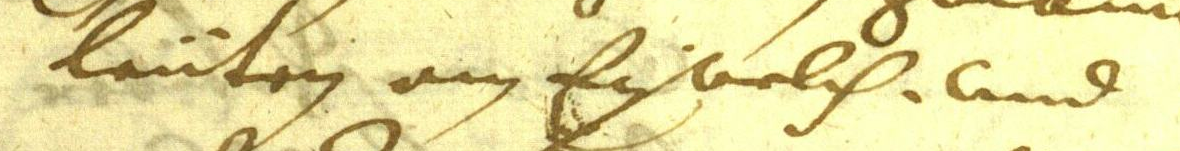leüten am Eisackh. vnd
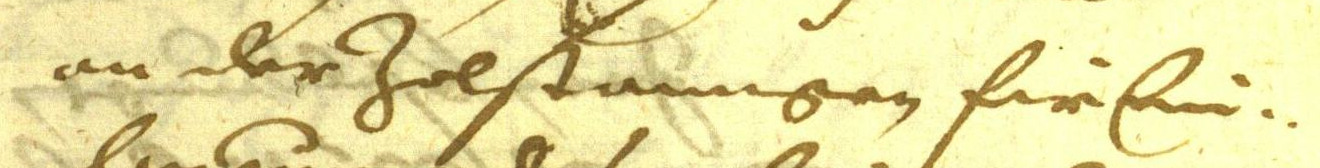an der Zolstanngen fir Ein¬
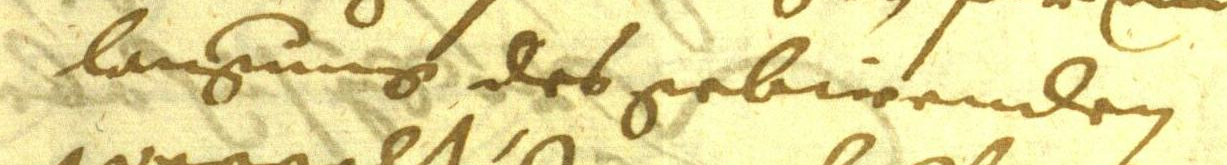langūng des gebirenden
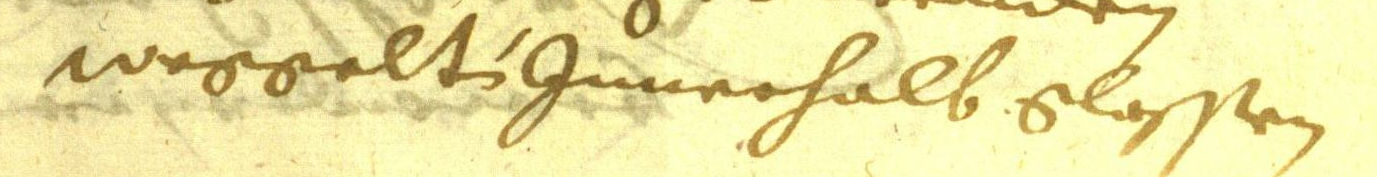weggelts Innerhalb glassen.
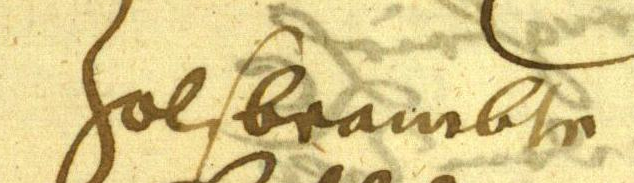Zolsbeambte
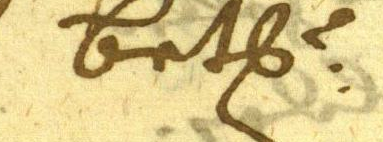bet:
